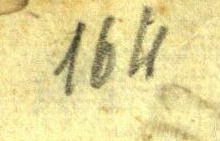164
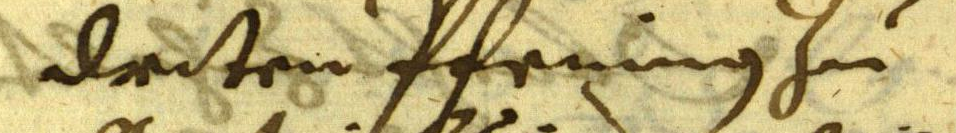driten Pfening Zū
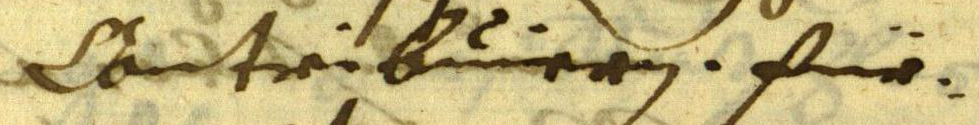Contribūiern. für¬
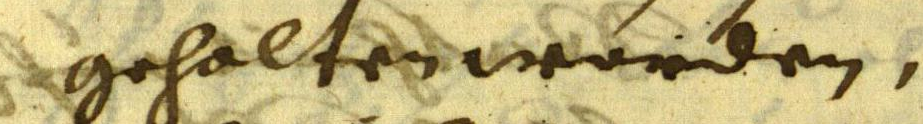gehalten worden,
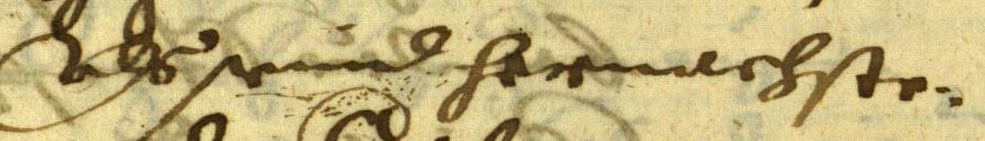Als seind hernachste¬
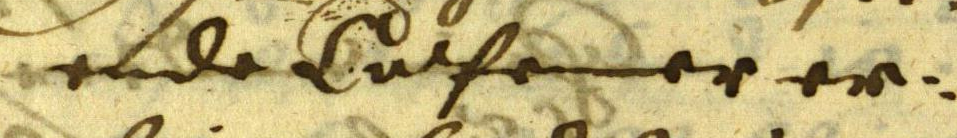ende Capenner er¬
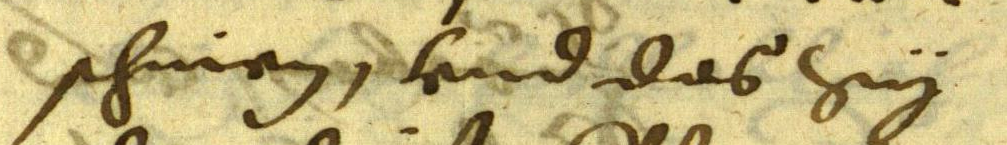schinen, vnd das Sÿ
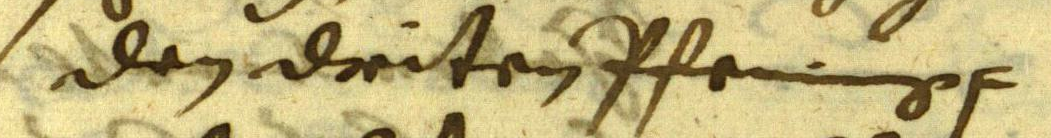den driten Pfening
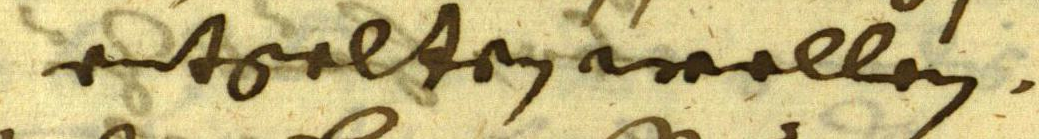entgelten wellen.
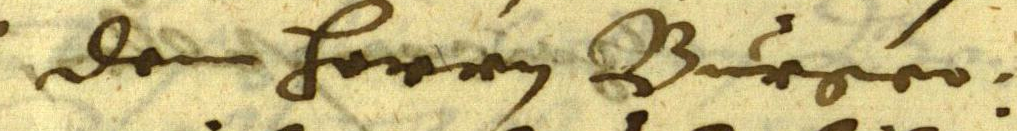dem herrn Būrger¬
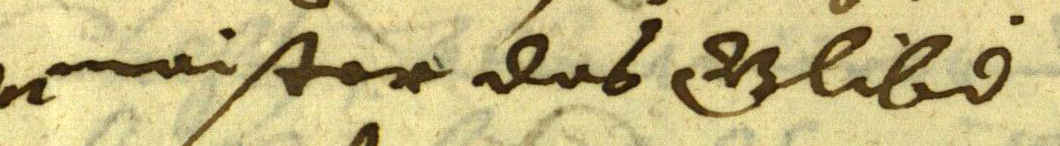maister das Glibd
